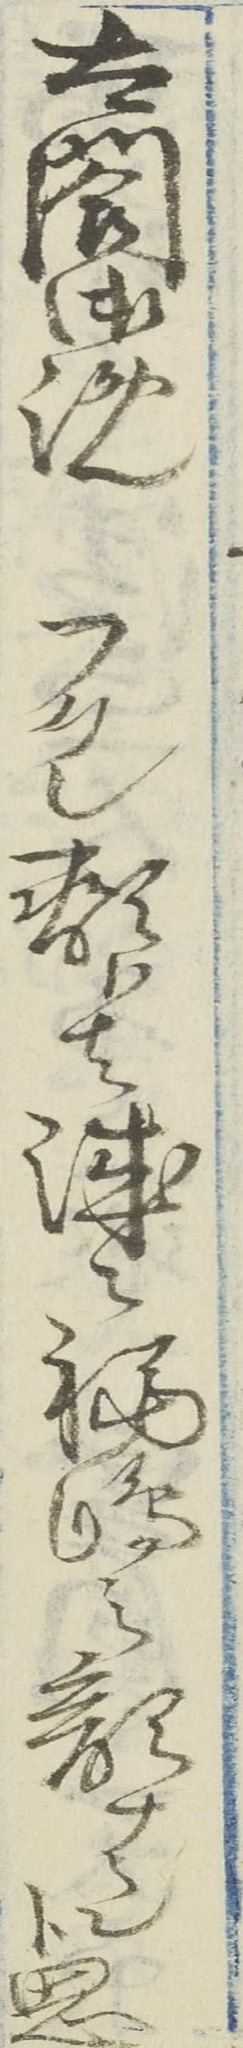太閤御覧フクレ頬ト者誠ニ福島之顔ナラント思
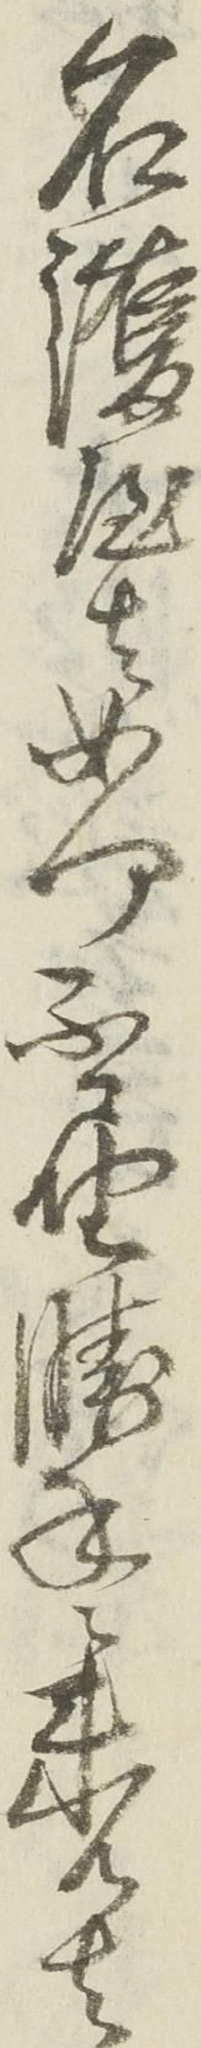秀名護屋者如何不届勝手ニ来ル者
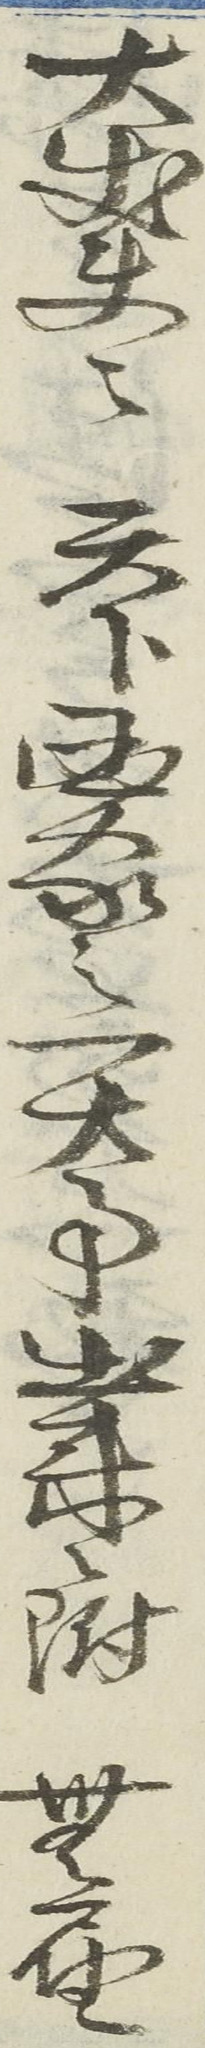大丈夫也天下国家之一大事出来之附無届
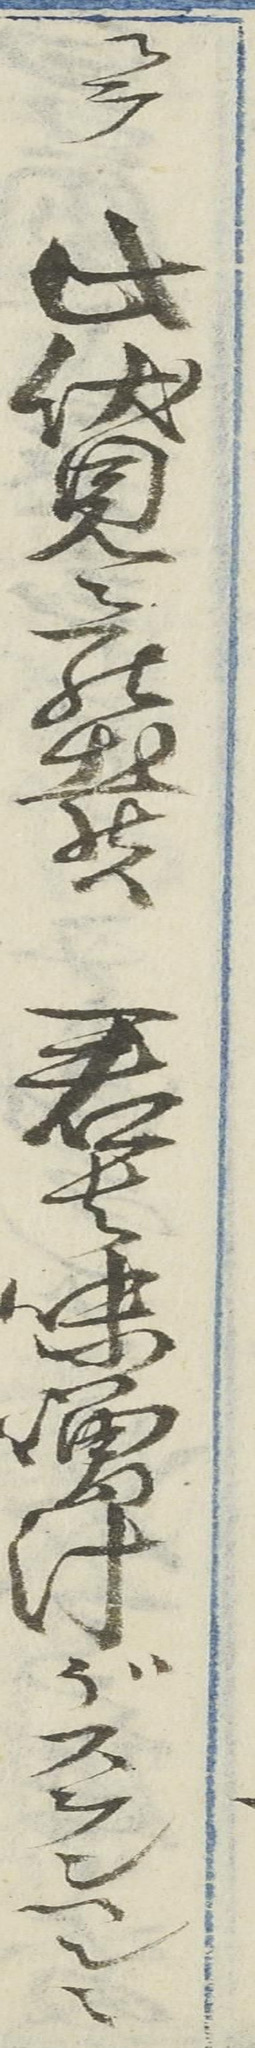ニテ此伏見ニ罷出候君者味噌汁がスヲンヘン也
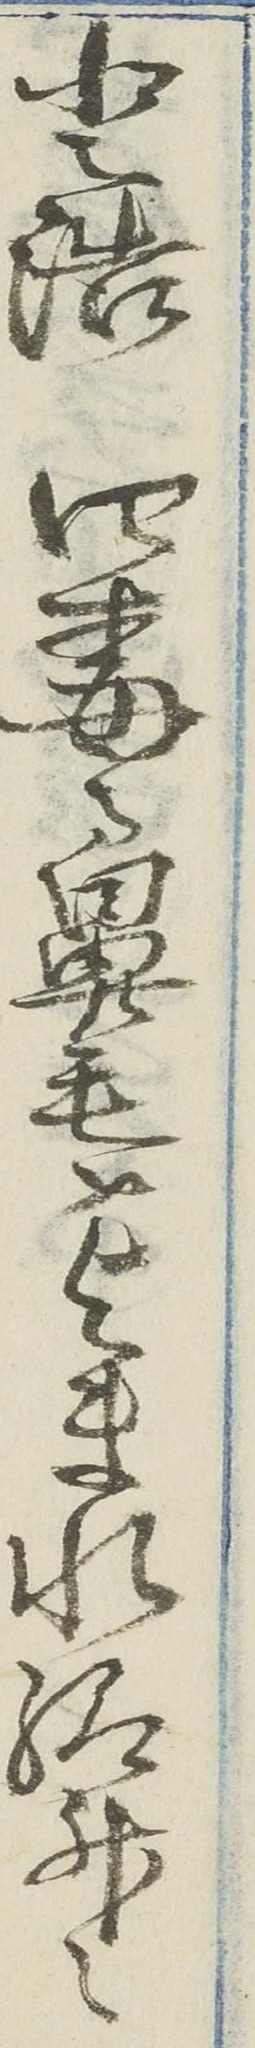と詰四毒之鼻毛ヲとまれ給升也
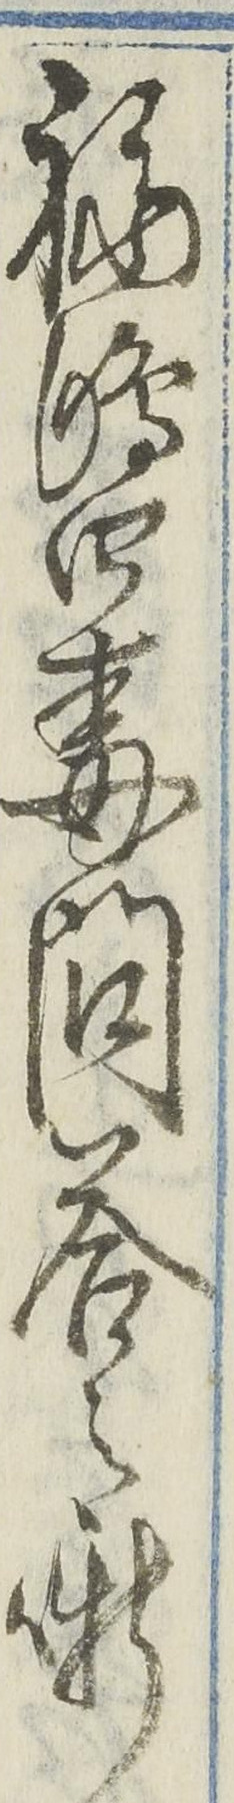福島四毒問答之囃
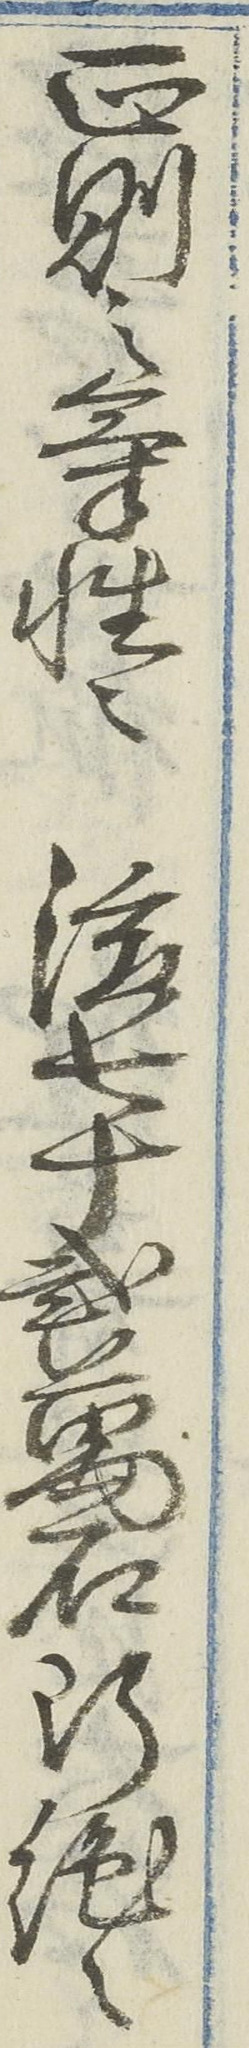正則之気性也後七十弐万石断絶也
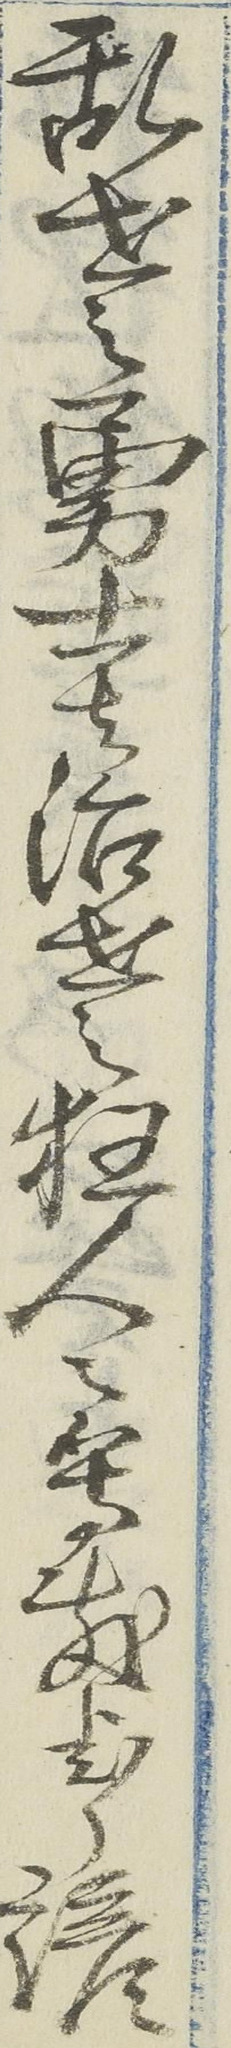乱世之勇士者治世之狂人ニ等敷ト云リ諺
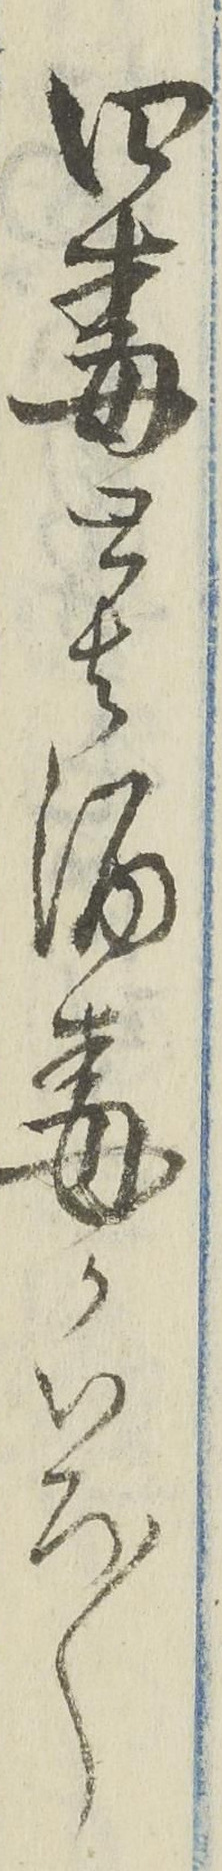秀四毒共者酒毒かいろ〳〵

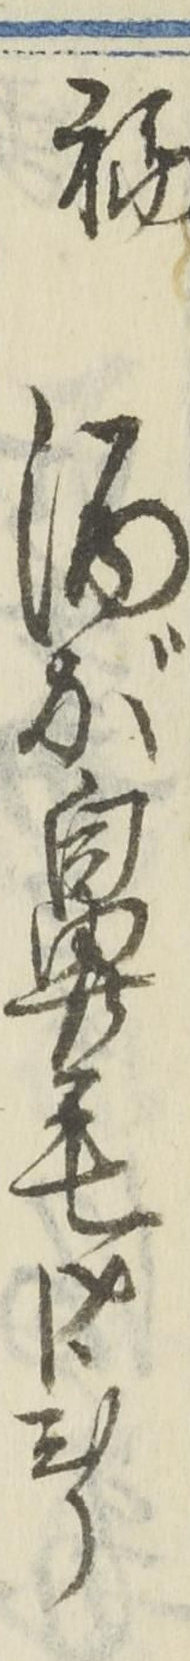福酒が鼻毛ヲト云う
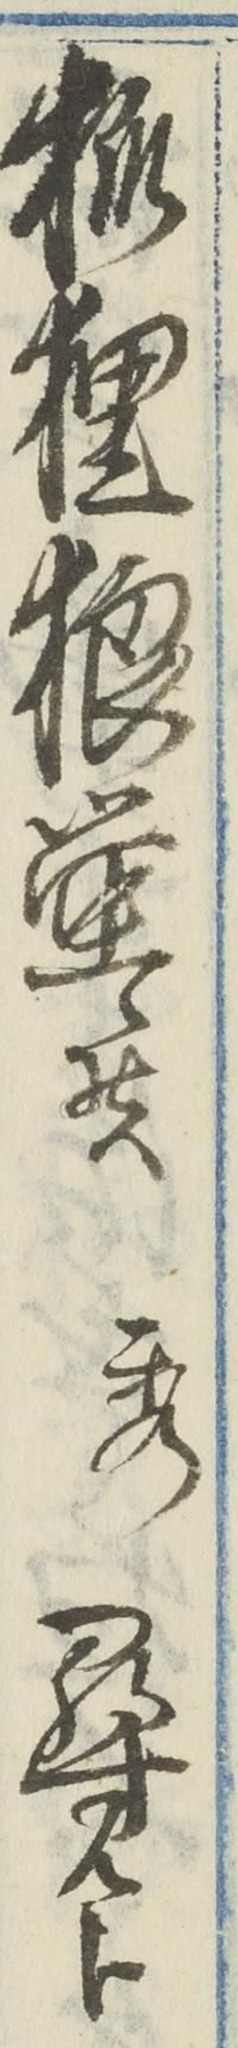狐狸狼蛍二候秀尋ルト
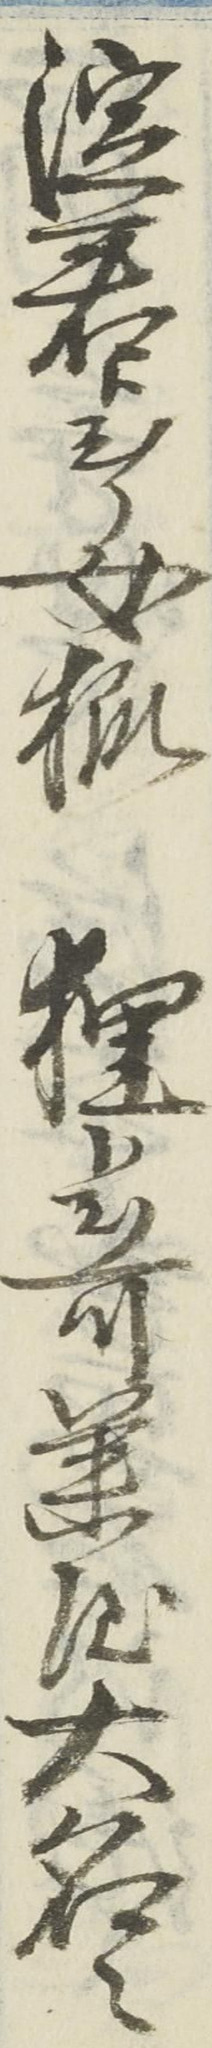淀君ト云う女狐狸ト云可薬屋大名之
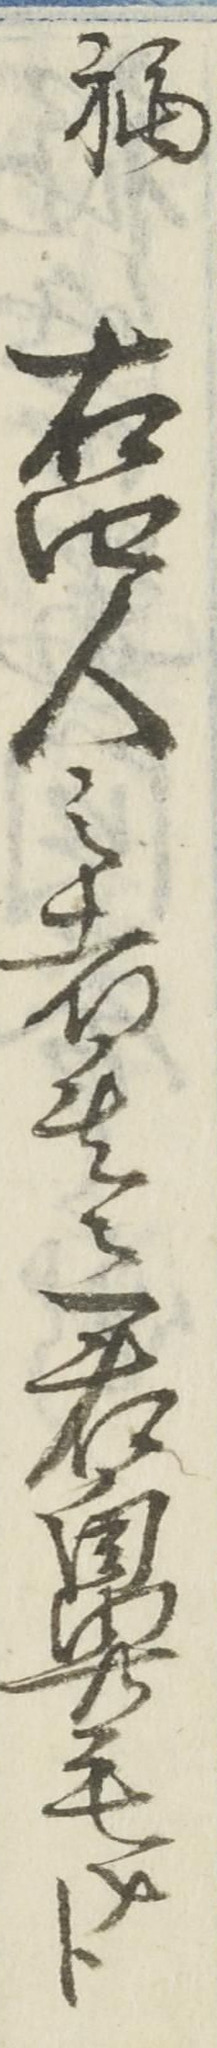福右四人之者共ニ君鼻毛ヲト
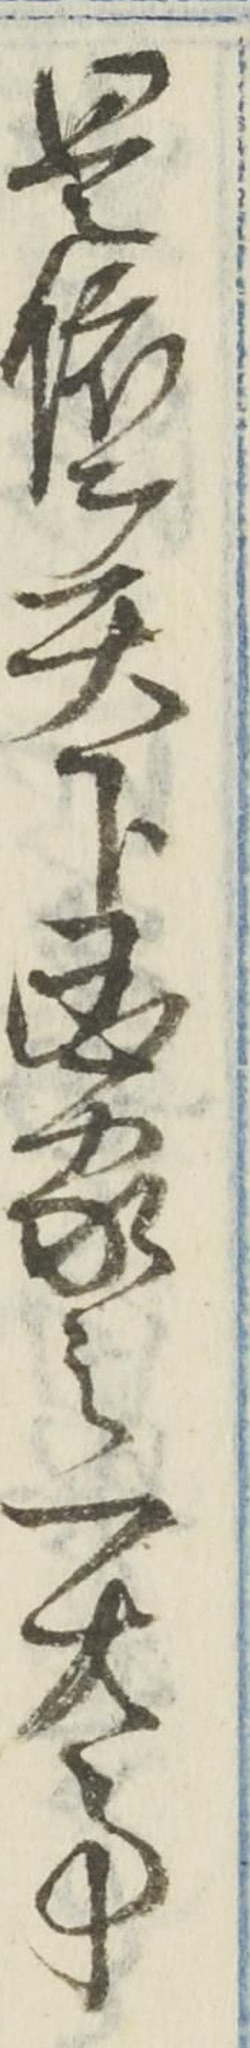是依テ天下国家之一大事
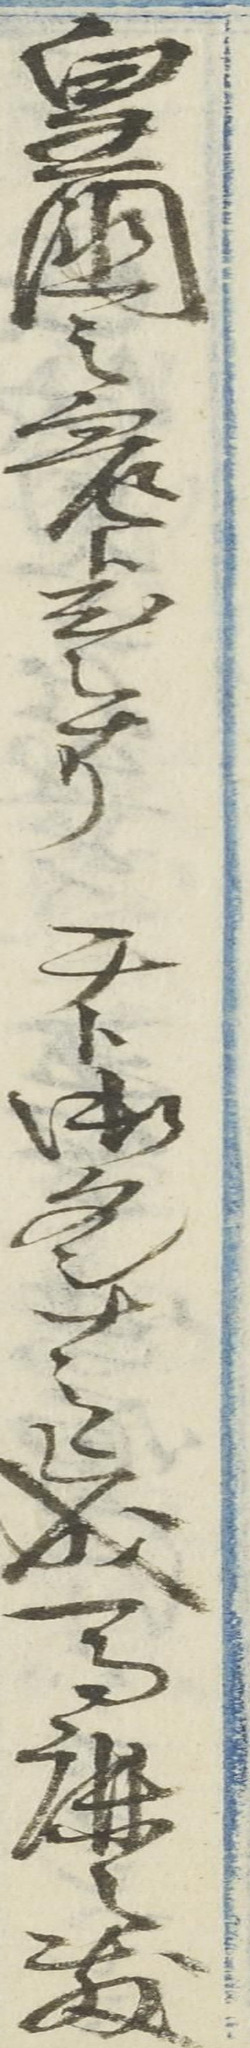皇国之鼻ト云シナリチト御タシナミ成馬鹿〻敷
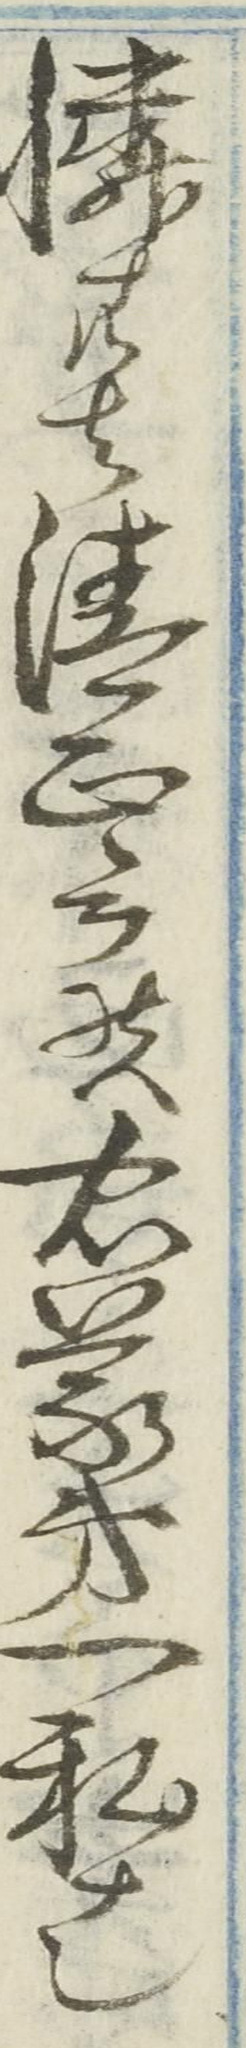憐れナルは清正二テ候忠義第一私ナシ
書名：伏水大地震
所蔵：東京大学地震研究所図書室 Earthquake Research Institute Library, The University of Tokyo, JAPAN
